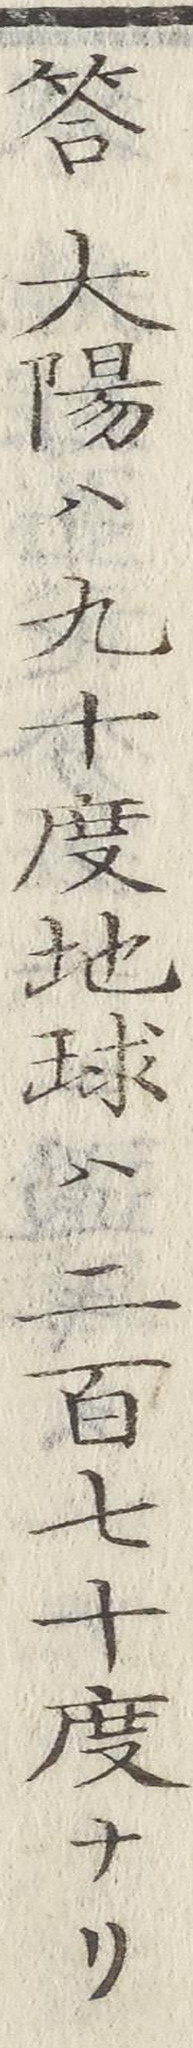答大陽ハ九十度地球ハ二百七十度ナリ
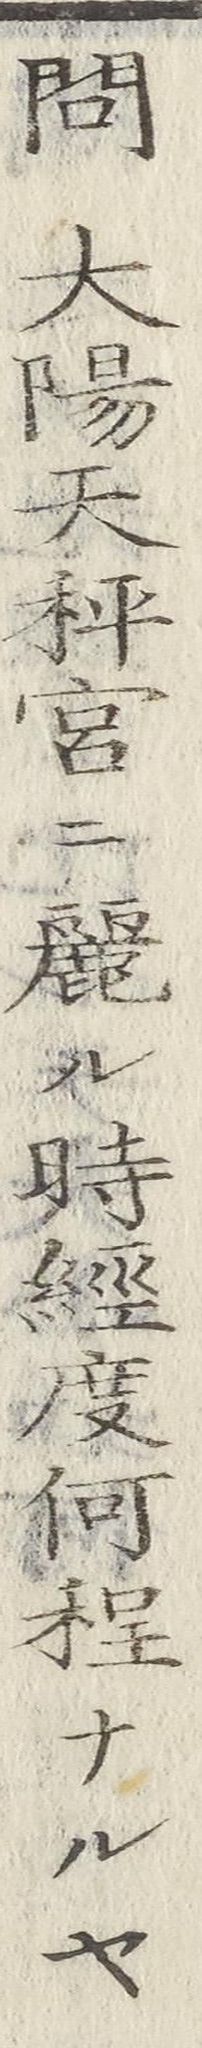問大陽天秤宮ニ麗ル時経度何程ナルヤ
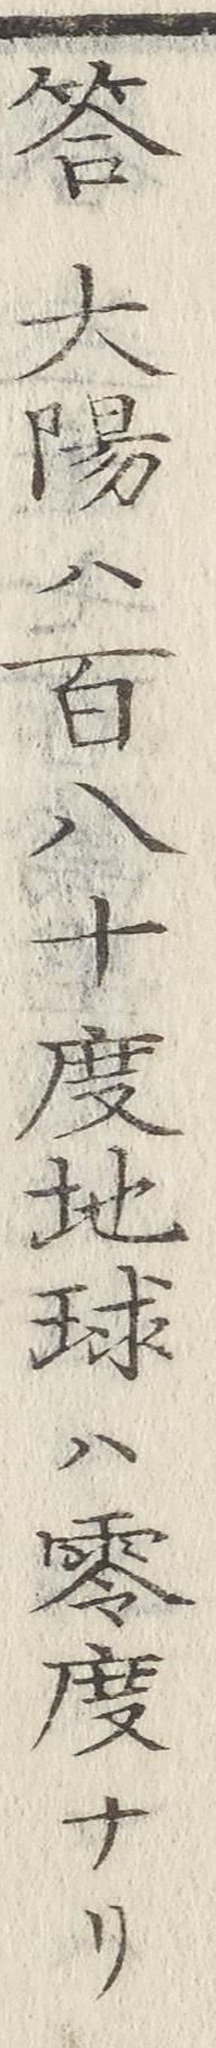答大陽ハ百八十度地球ハ零度ナリ
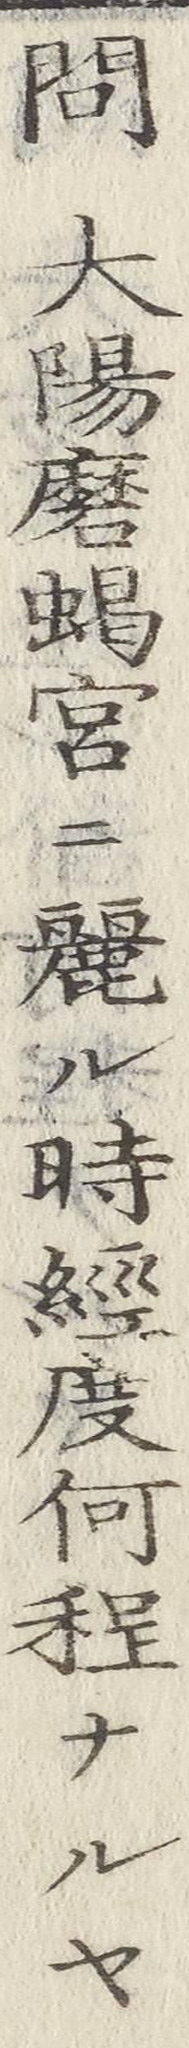問大陽磨蝎宮ニ麗ル時経度何程ナルヤ
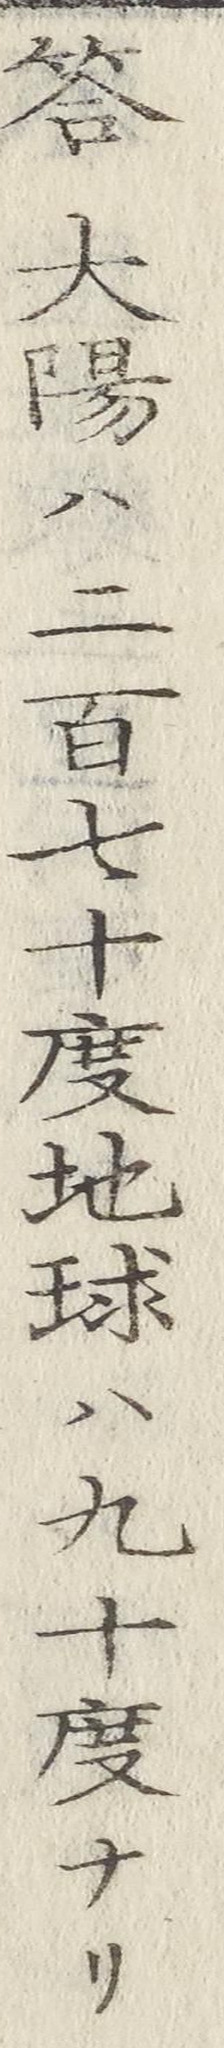答大陽ハ二百七十度地球ハ九十度ナリ
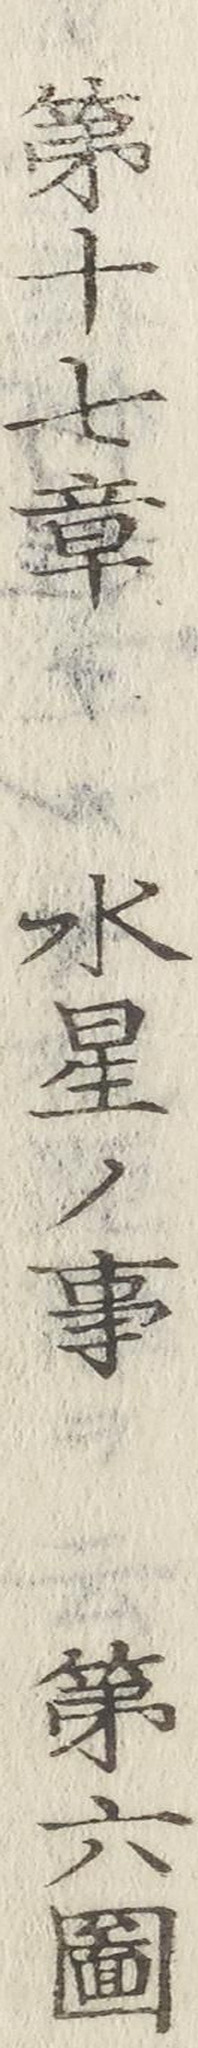第十七章水星ノ事第六図
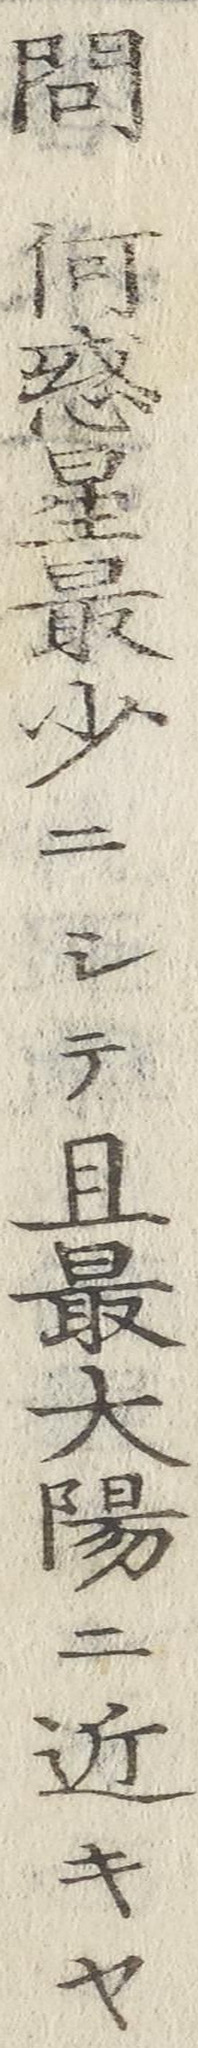問何惑星最少ニシテ且最大陽ニ近キヤ

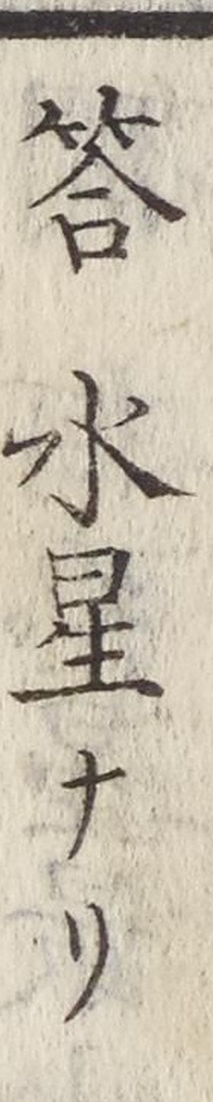答水星ナリ
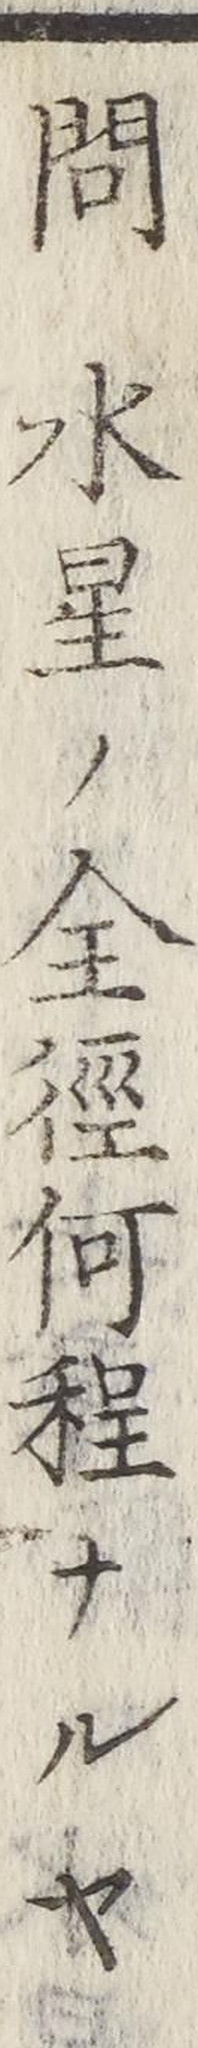問水星ノ全径何程ナルヤ
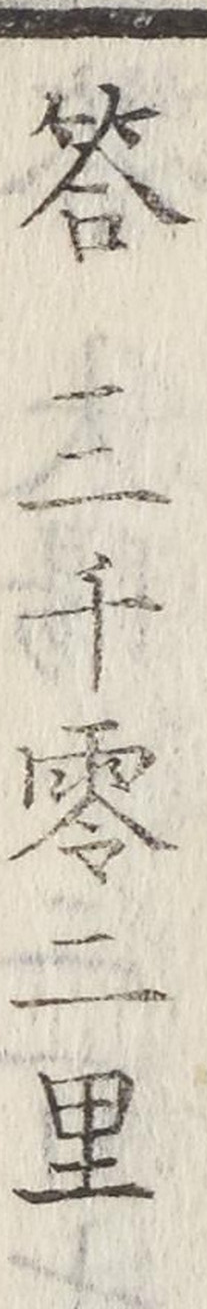答三千零二里
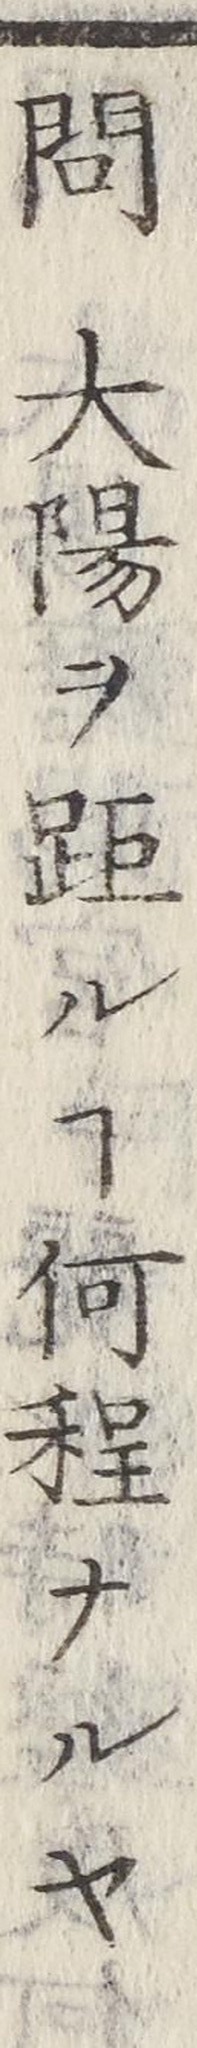問大陽ヲ距ルコト何程ナルヤ
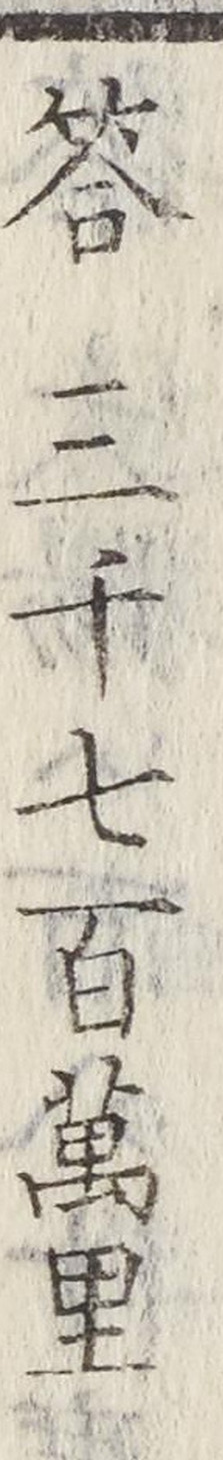答三千七百萬里
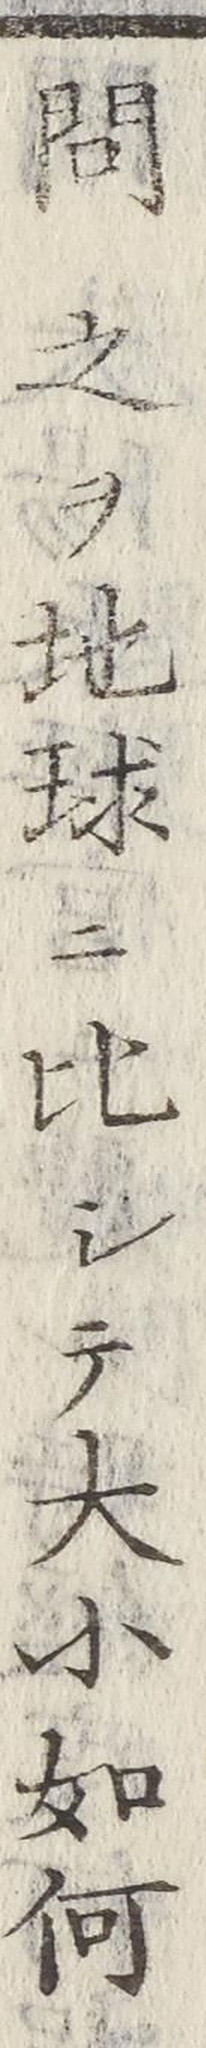問之ヲ地球ニ比シテ大小如何
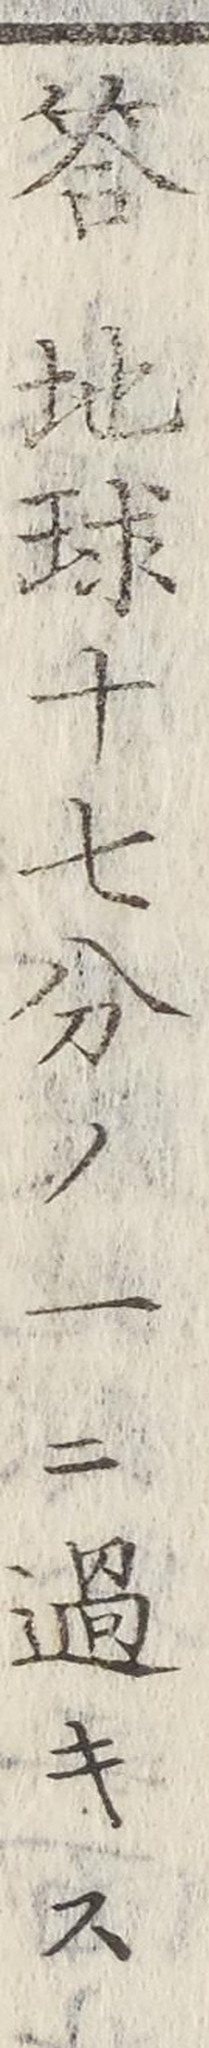答地球十七分ノ一ニ過キス
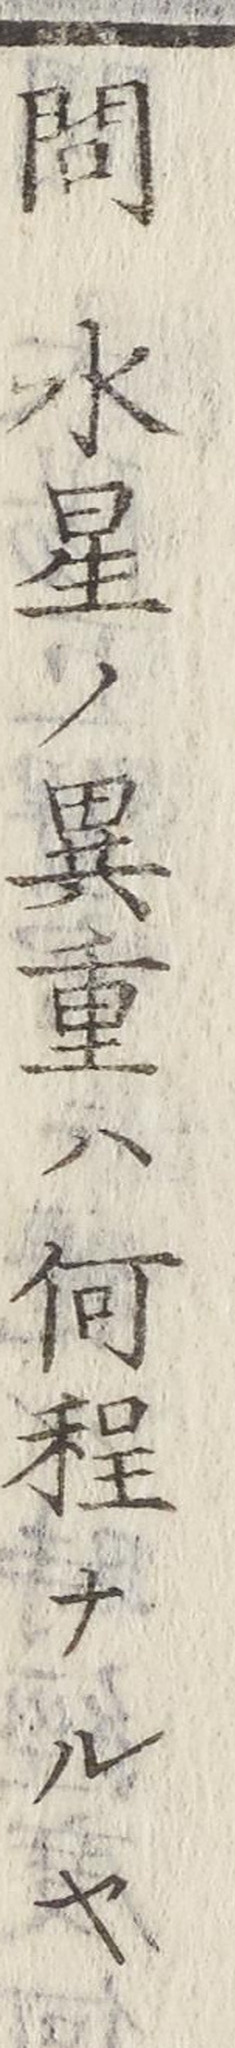問水星ノ異重ハ何程ナルヤ
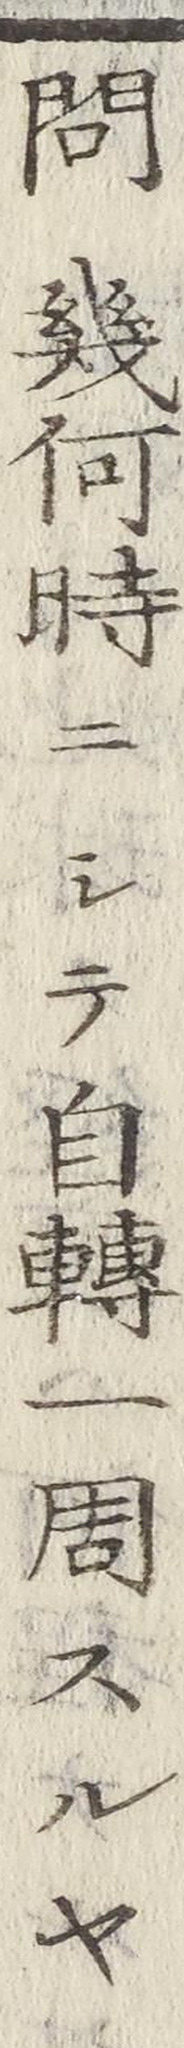問幾何時ニシテ自転一周スルヤ
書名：星学圖説　上
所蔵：東京大学地震研究所図書室 Earthquake Research Institute Library, The University of Tokyo, JAPAN
